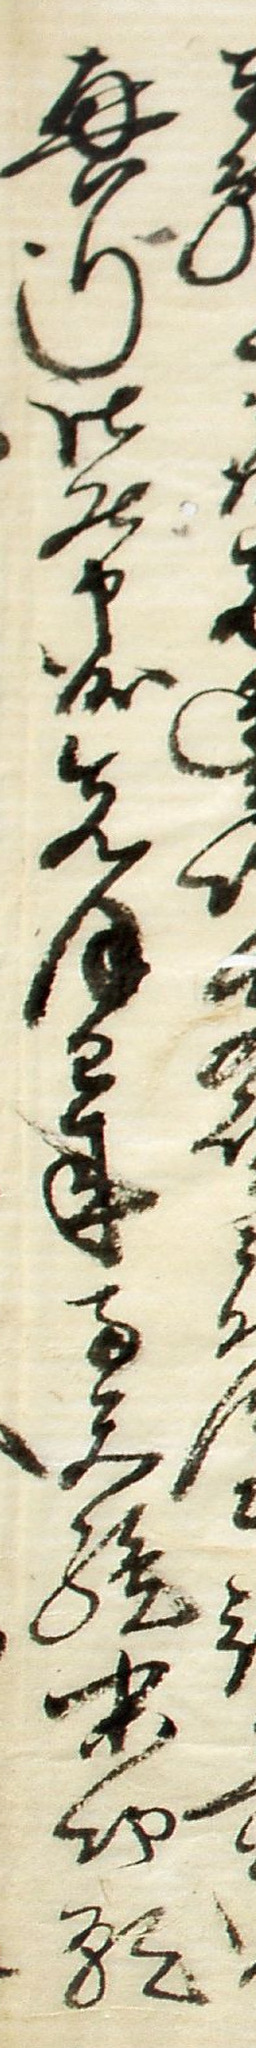興行仕居申所先月已来雨天續未御願
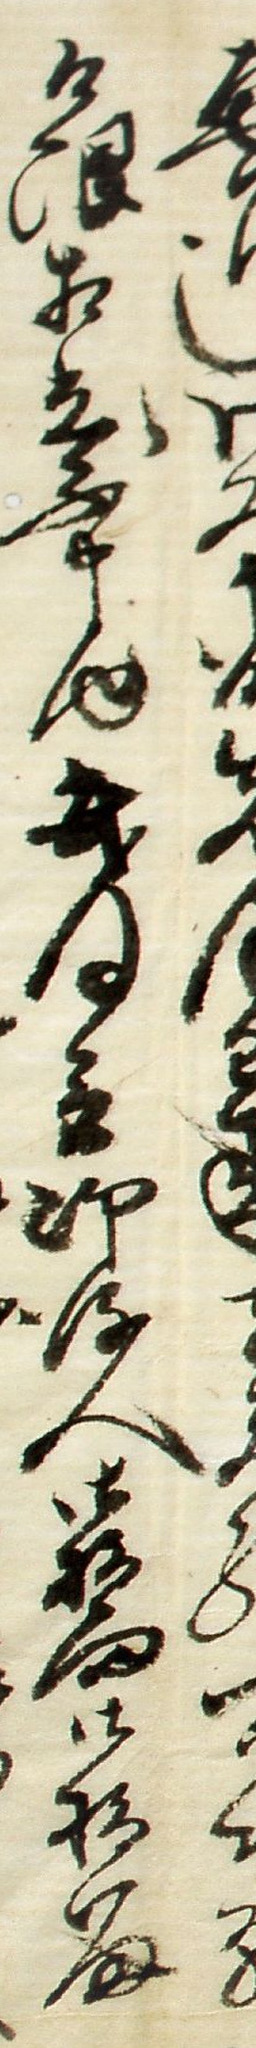日限相立不申内此月三日御役人御指向御指留
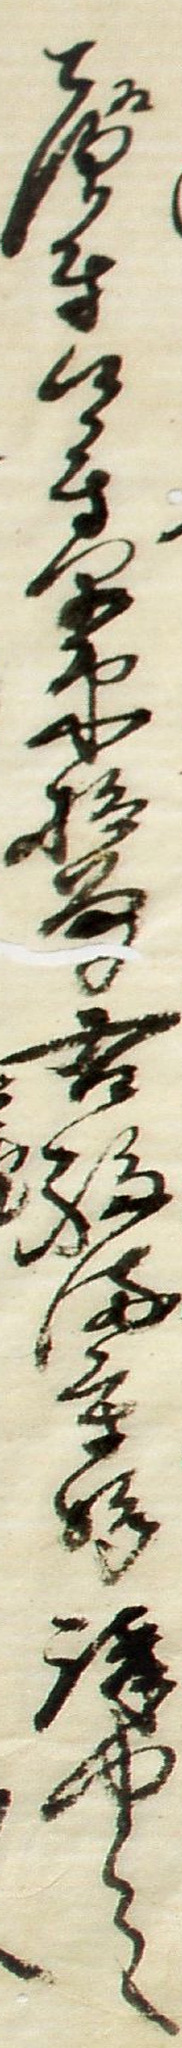被為仰付候ニ付早束指留メ右福満寺始メ講中之

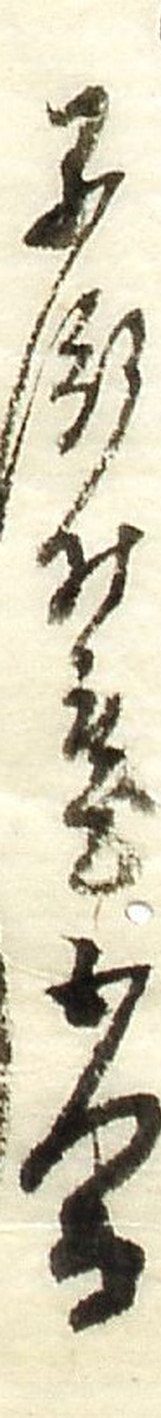早渕村庄屋五人与
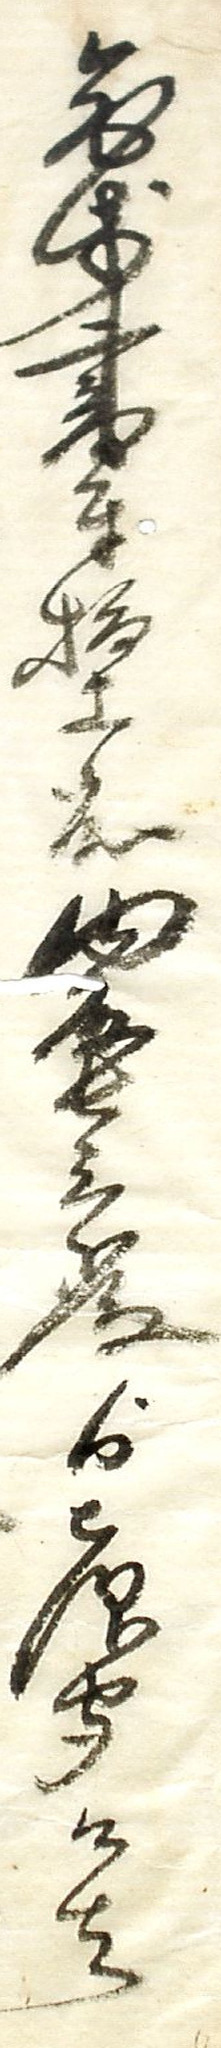別帋書付指上候所内藤長三郎殿ゟ被仰聞候者
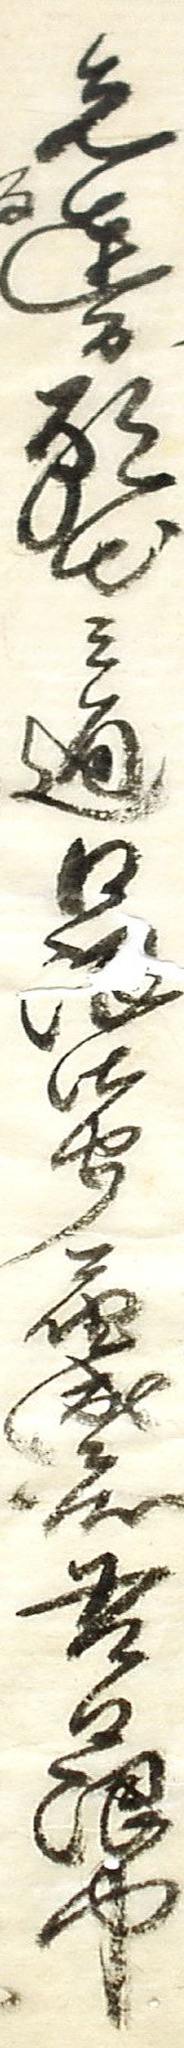先達而願出之通日限御聞届成候所右日限中
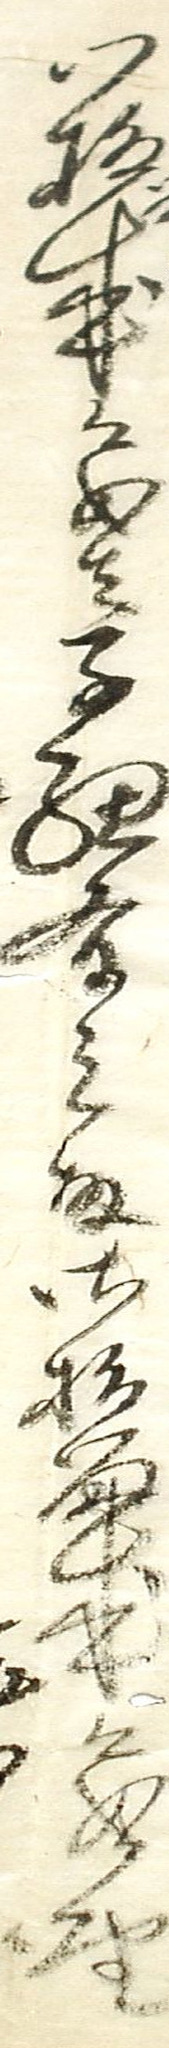御指留成候義者子細有之故御指留成候義御坐
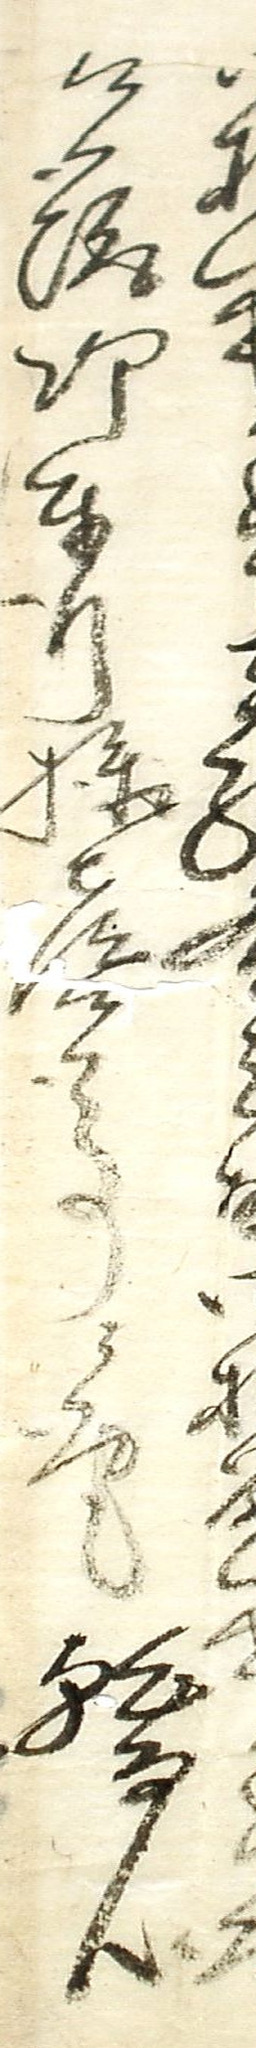候御趣御奉行様被仰候御事ニ御坐候就而ハ
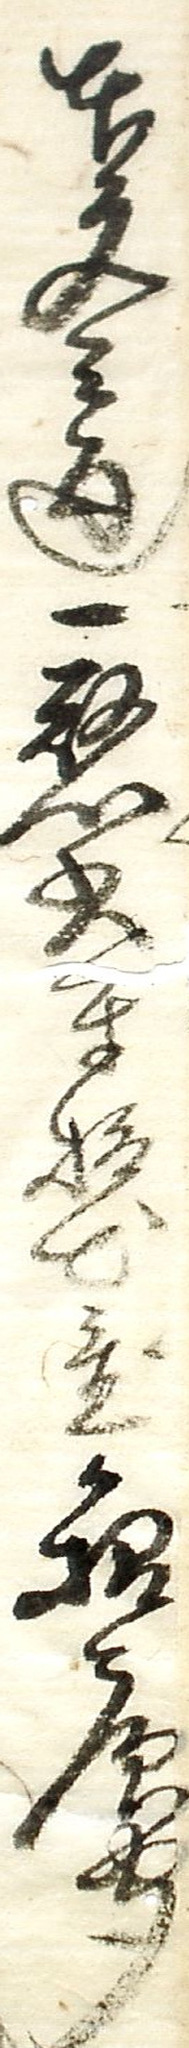本文之通一應書付指出置候様被仰聞
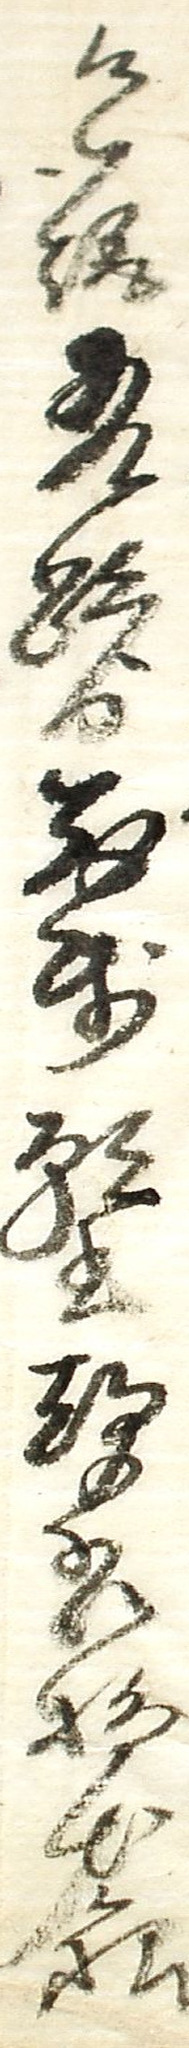候御趣右跡ゟ別帋願書都メ書指出候様
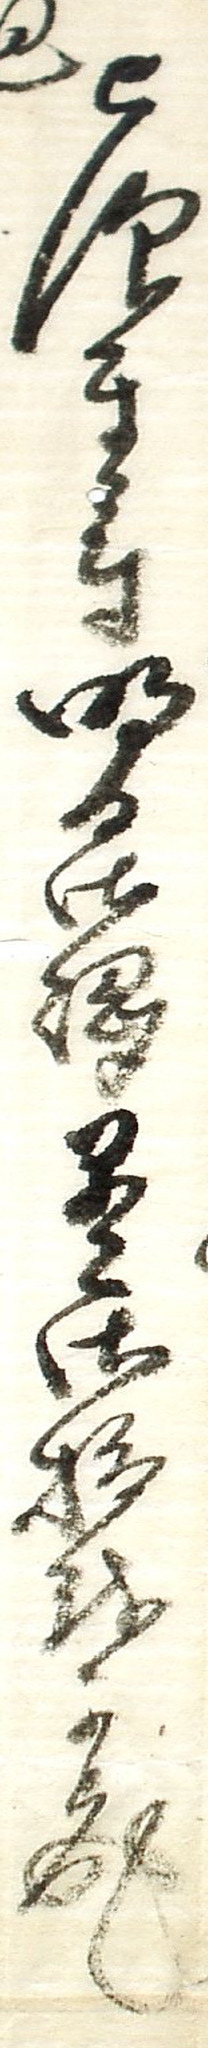被仰付二付明日御認メ早々御指越可被成候
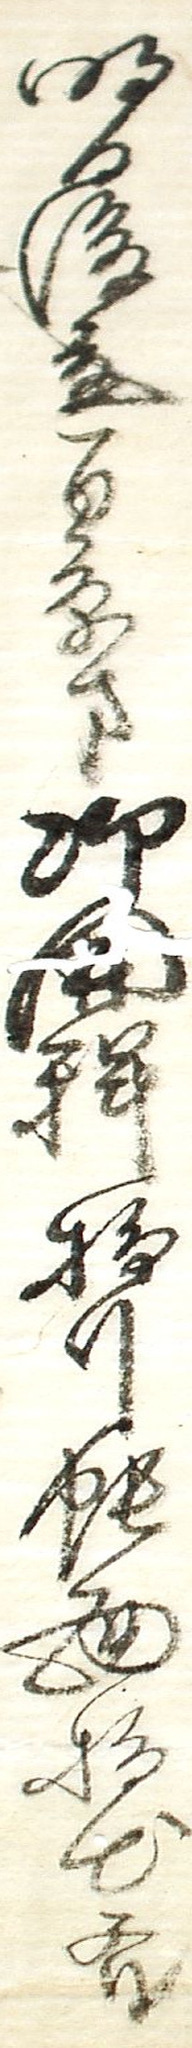廻明日後藤百兵衛方御開稈指引帳面指出右
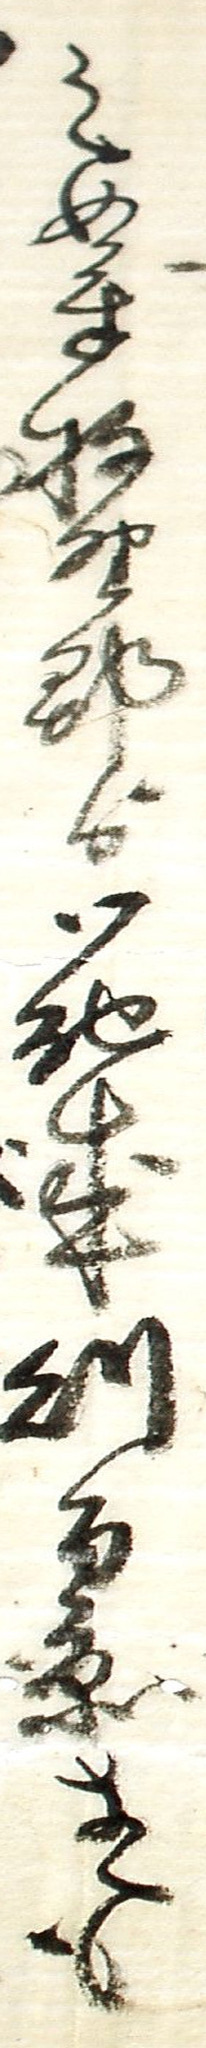之義ニ付板野郡ゟ御配成則百兵衛方へも
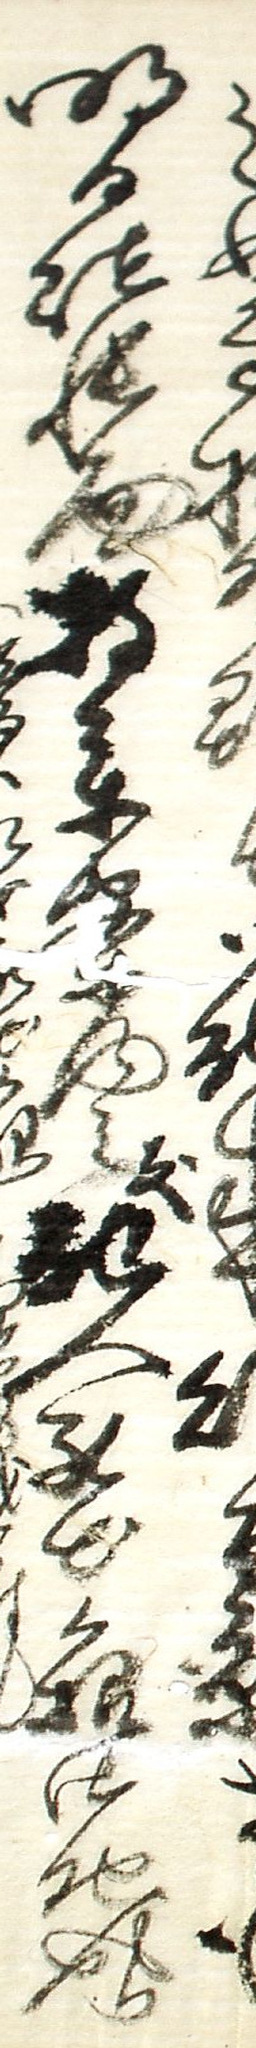明日諸帳面持参御案内之支配人罷出候様御配成り
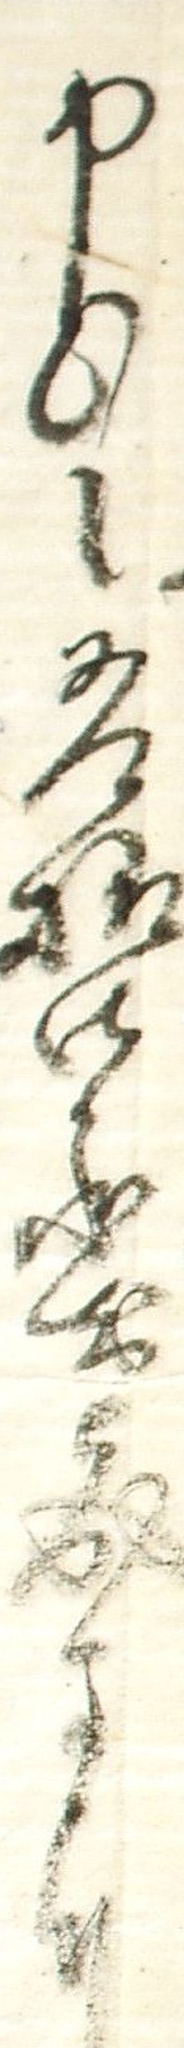申上候右様御承知被成事二候以上
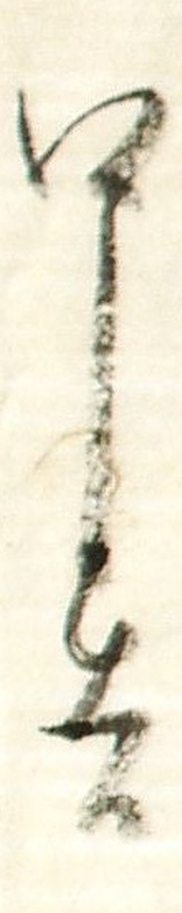四月十一日
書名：(早渕村福満寺子供浄瑠璃願書）他
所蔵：鳴門教育大学 Naruto University of Education
